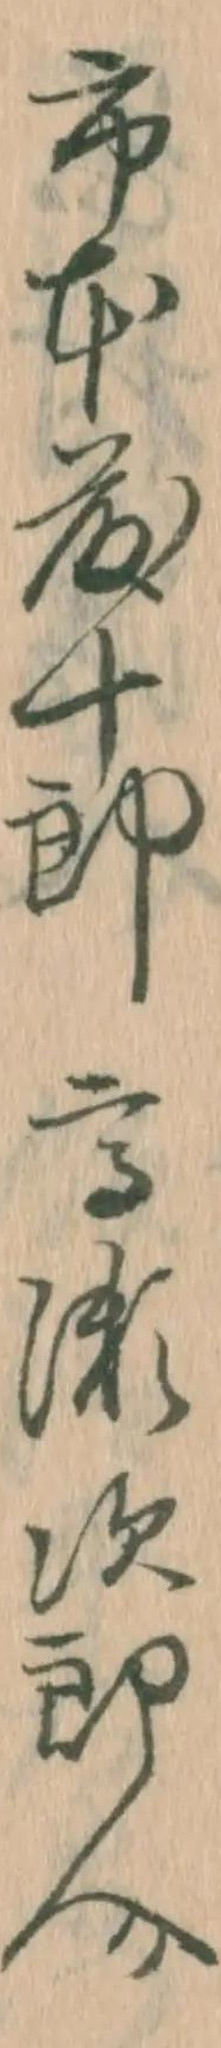市本藤十郎高瀬次郎介
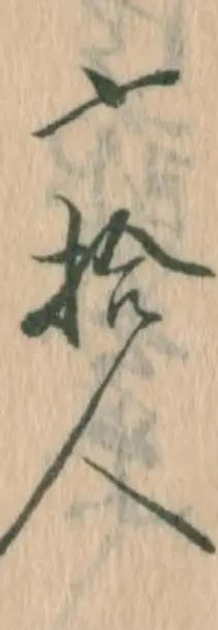〆拾人
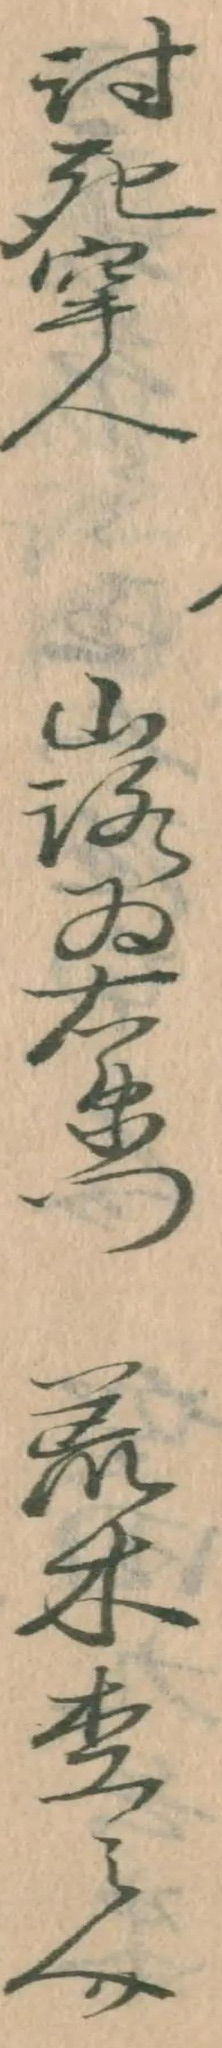討死牢人山路ゐ右衛門荒木杢之介
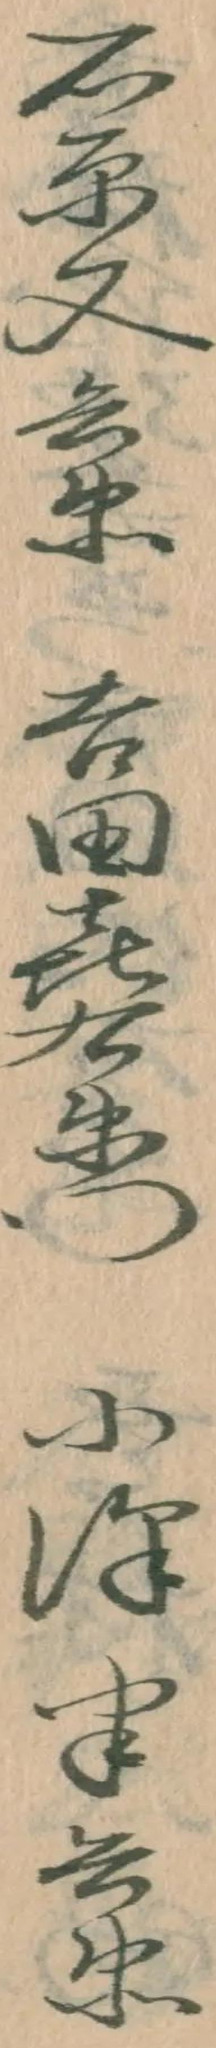石原又兵衛吉田喜右衛門小沢半兵衛
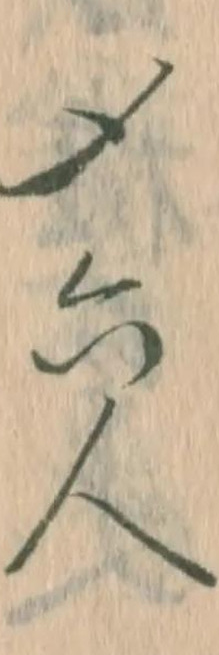〆六人
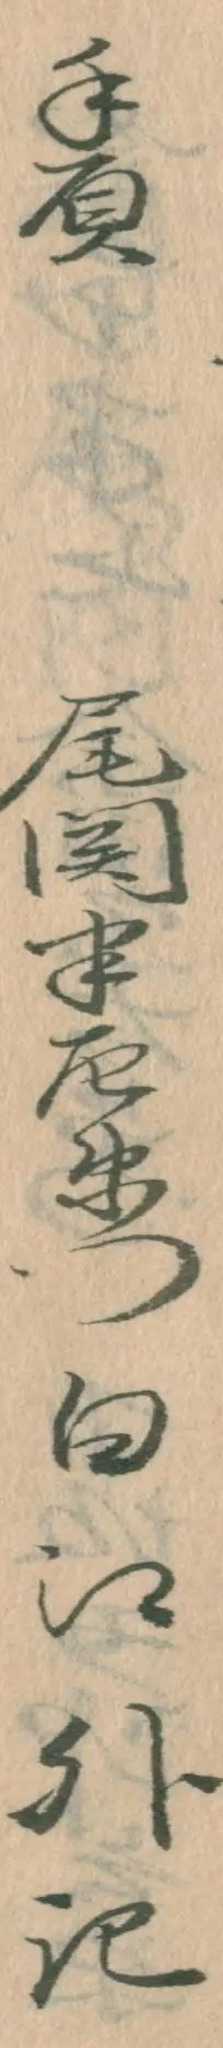手負尾関半左衛門白江外記
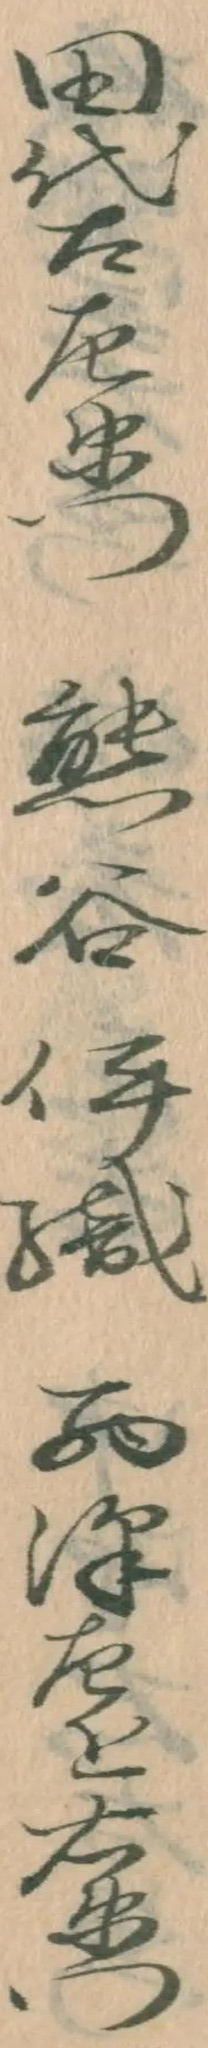田代太左衛門熊谷伊織西沢左近右衛門
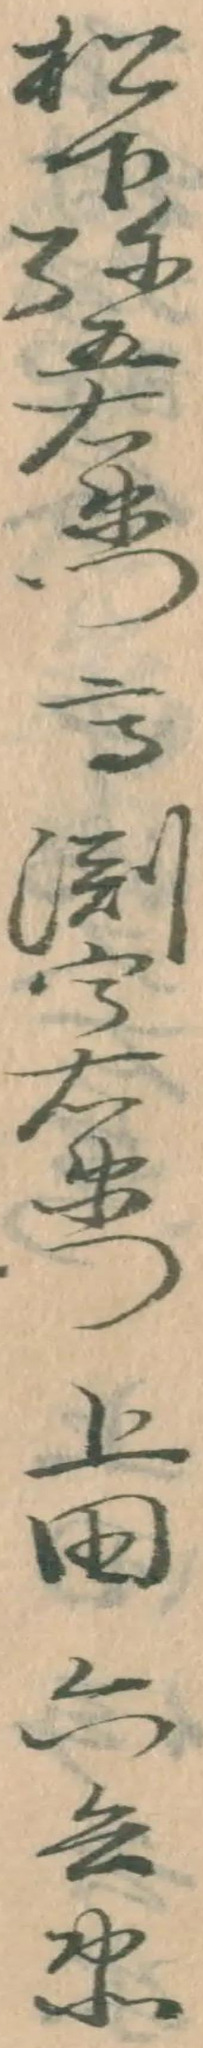松下弥五右衛門高瀬宇右衛門上田六兵衛

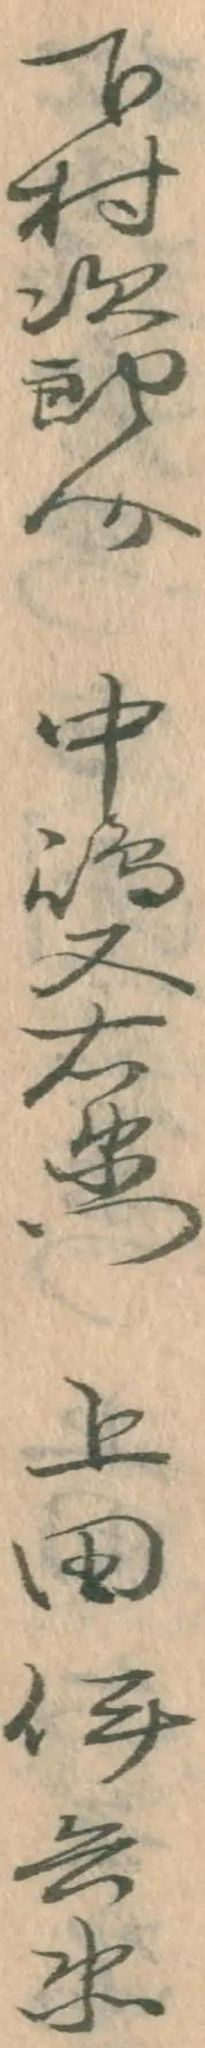下村次郎介中島又右衛門上田伊兵衛
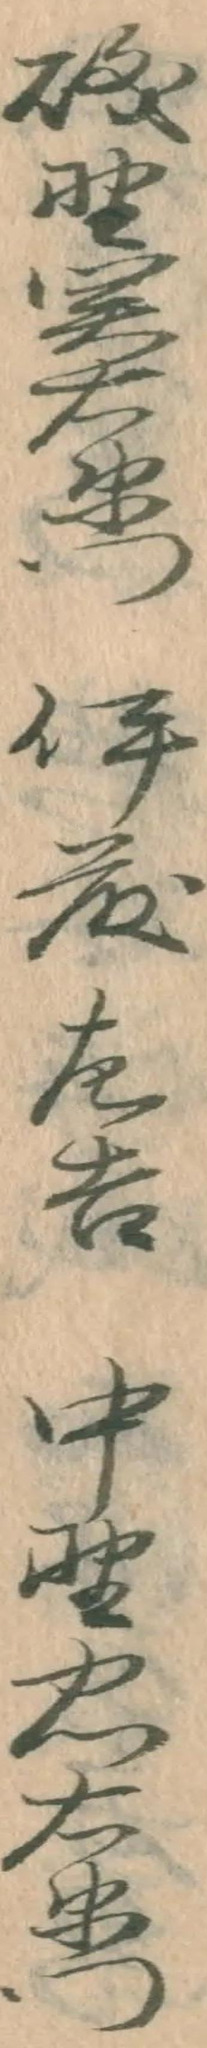磯野関右衛門伊藤左吉中野忠右衛門
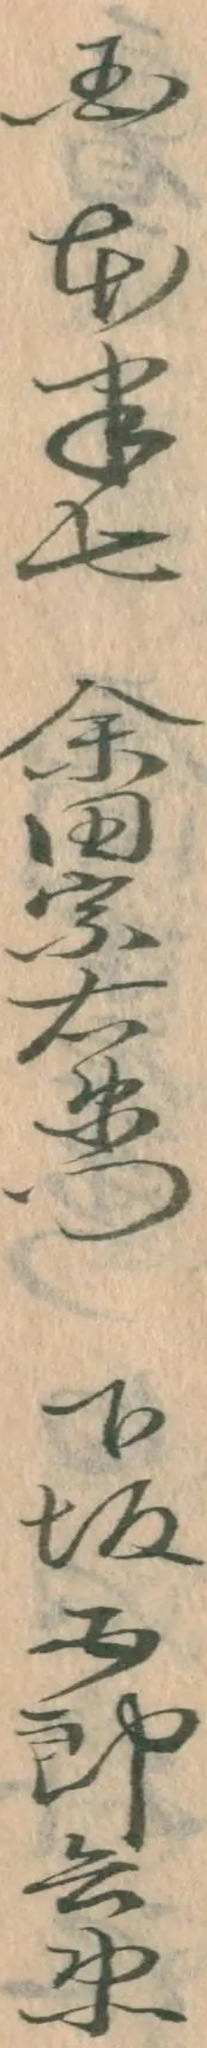国本半七余田宗右衛門下坂五郎兵衛
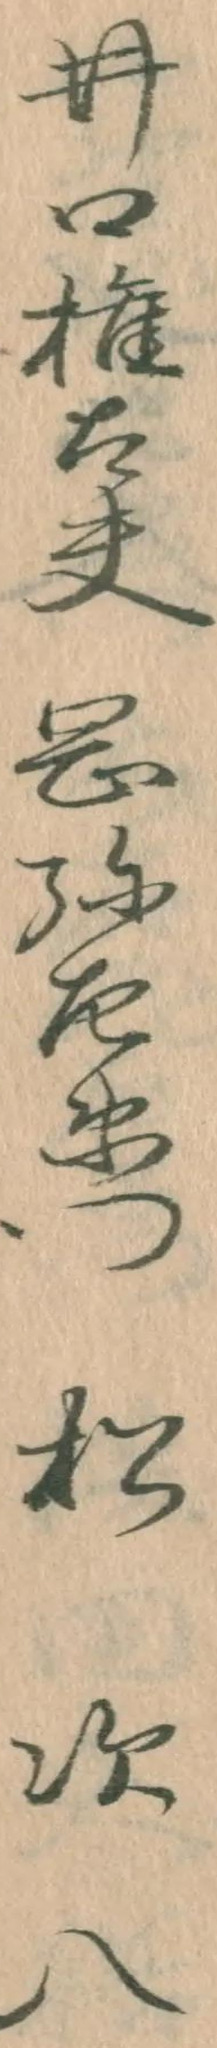以口権太夫岡弥左衛門松次八
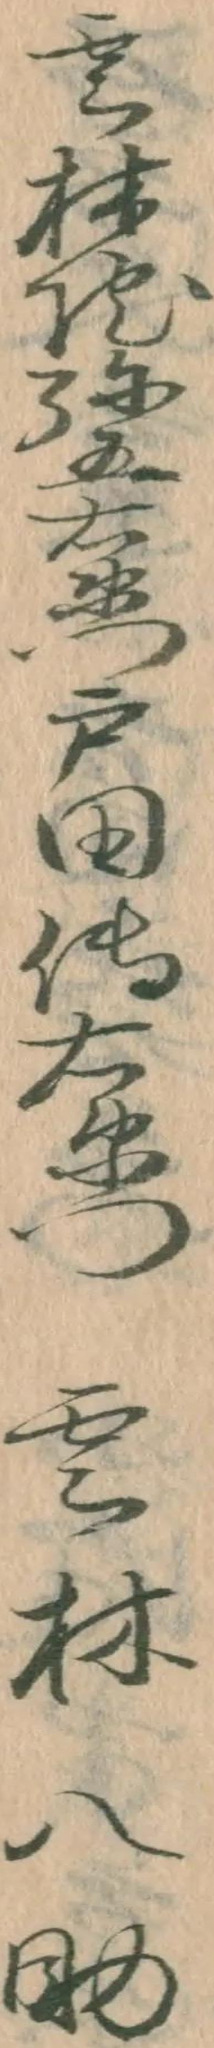雪林院弥五右衛門戸田伝右衛門雪林八助
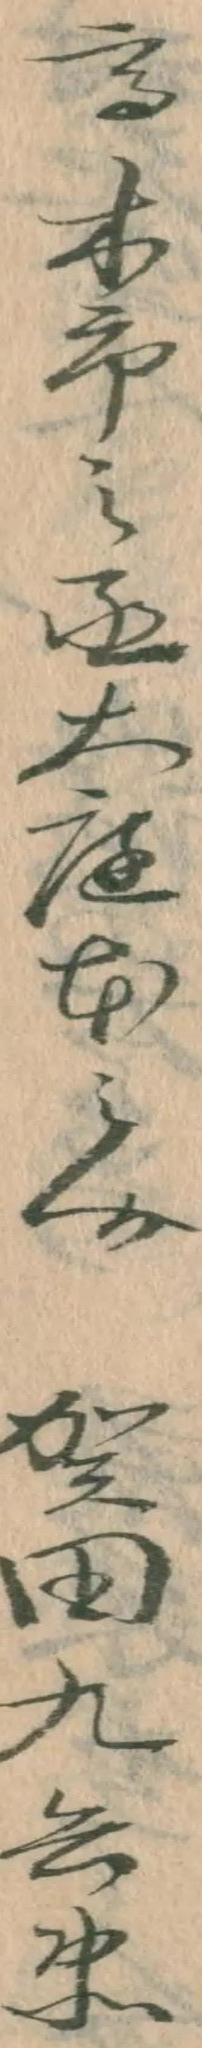高木市之丞大庭本之介賀田九兵衛
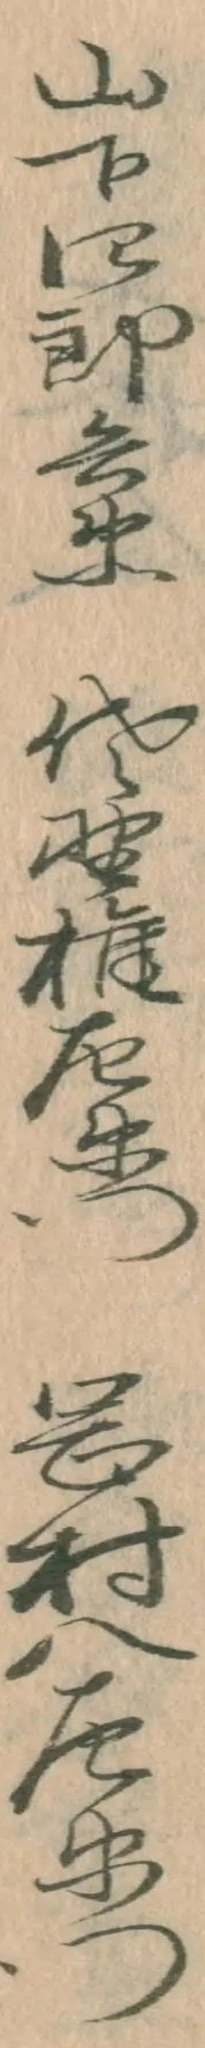山下四郎兵衛佐野権左衛門岡村八左衛門
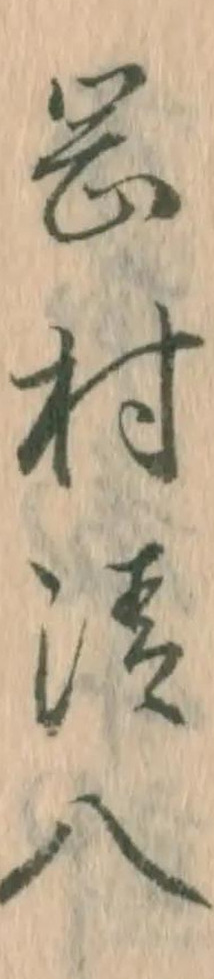岡村清八
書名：切支丹御退治記 49巻. [9]
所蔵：国立国会図書館 National Diet Library, JAPAN
